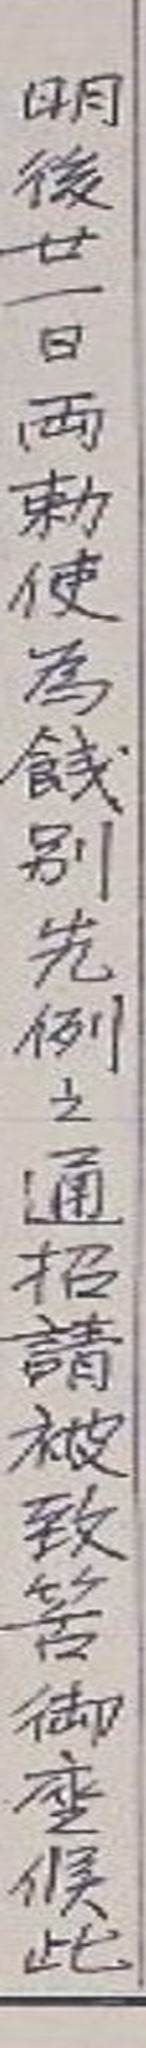明後廿一日両勅使為餞別先例之通招請被致筈御座候此
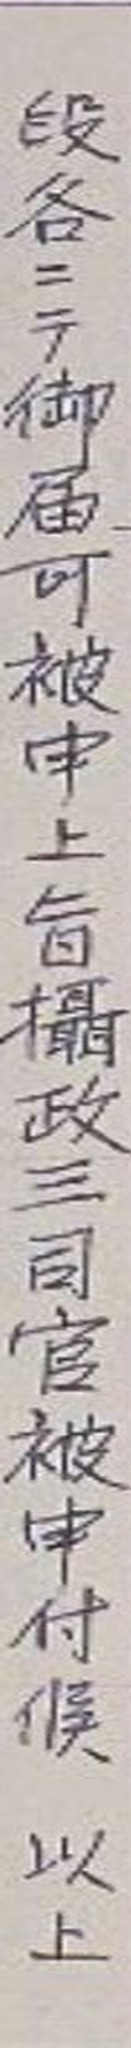段各にて御届可被申上旨摂政三司官被申付候以上
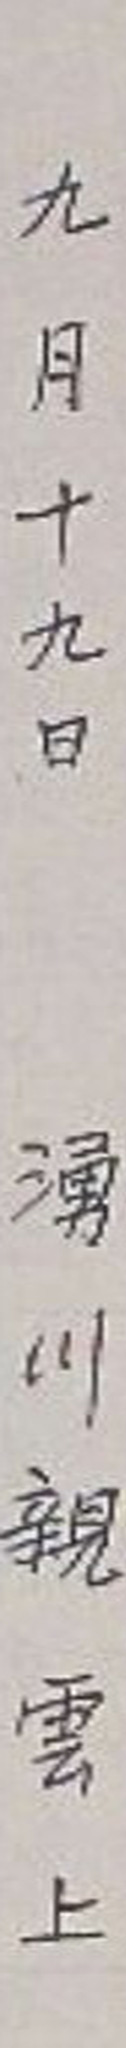九月十九日湧川親雲上
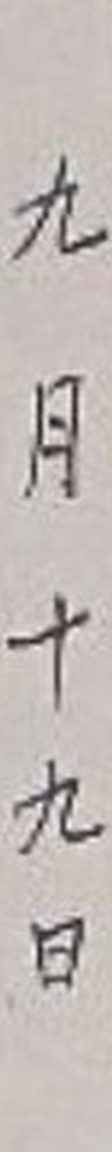九月十九日
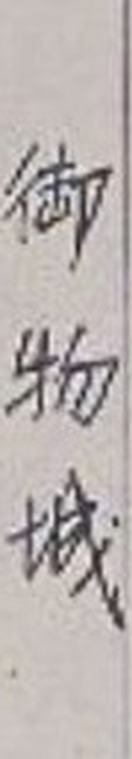御物城
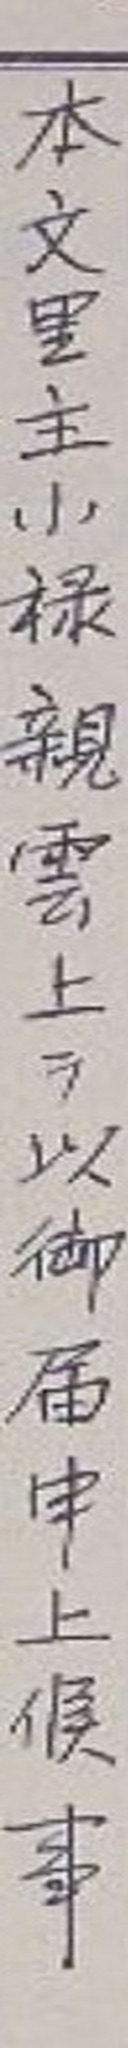本文里主小禄親雲上を以御届申上候事
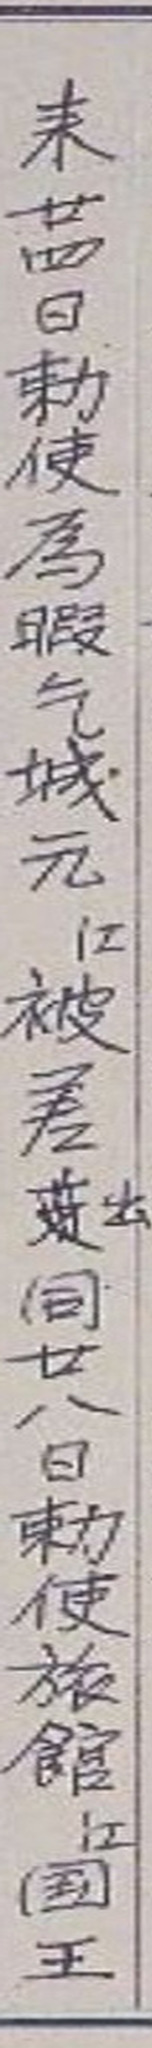来廿四日勅使為暇乞城元え被差出同廿八日勅使旅館え国王
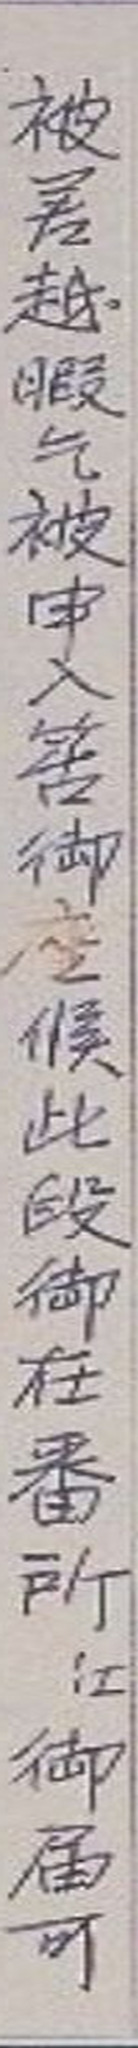被差越暇乞被申入筈御座候此段御在番所え御届可

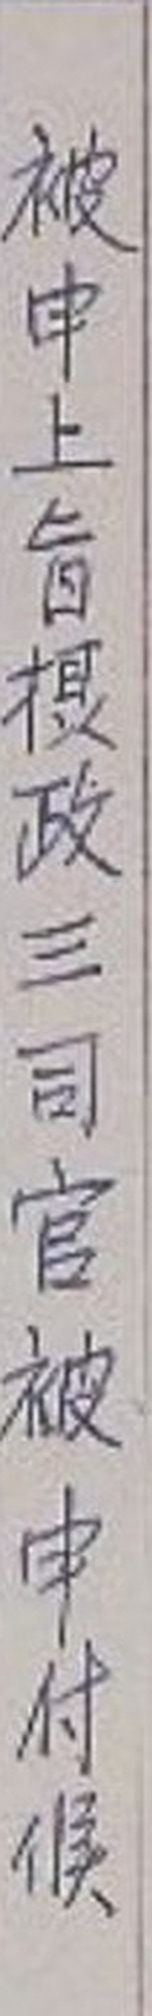被申上旨摂政三司官被申付候
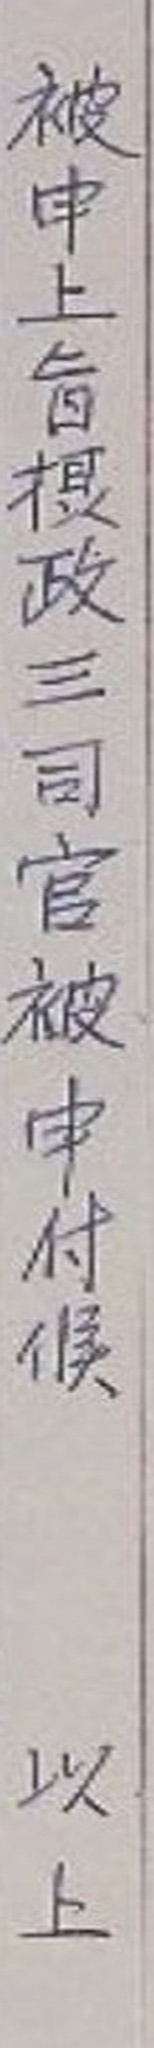被申上旨摂政三司官被申付候以上
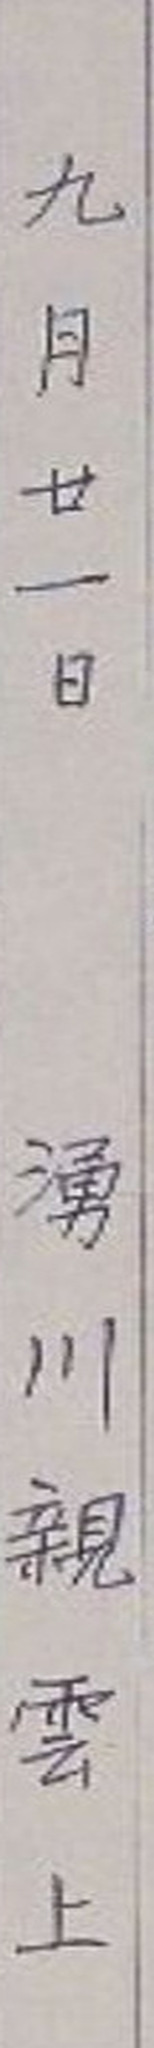九月廿一日湧川親雲上
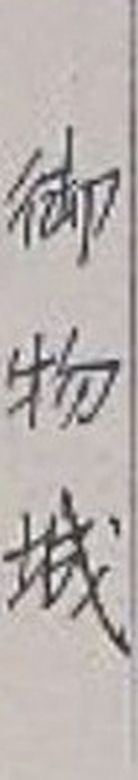御物城
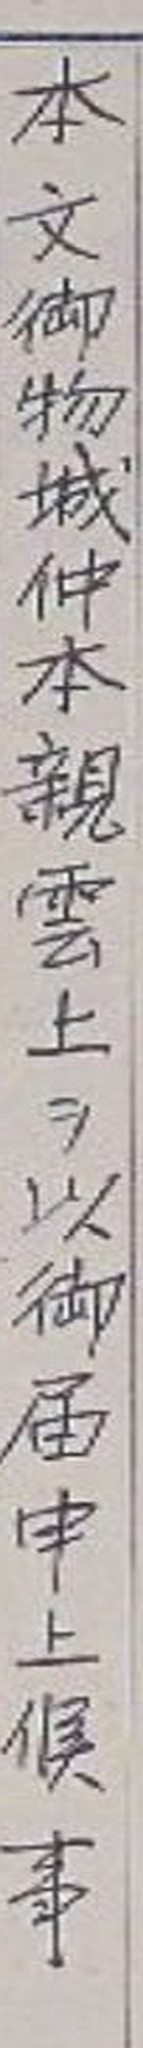本文御物城仲本親雲上を以御届申上候事
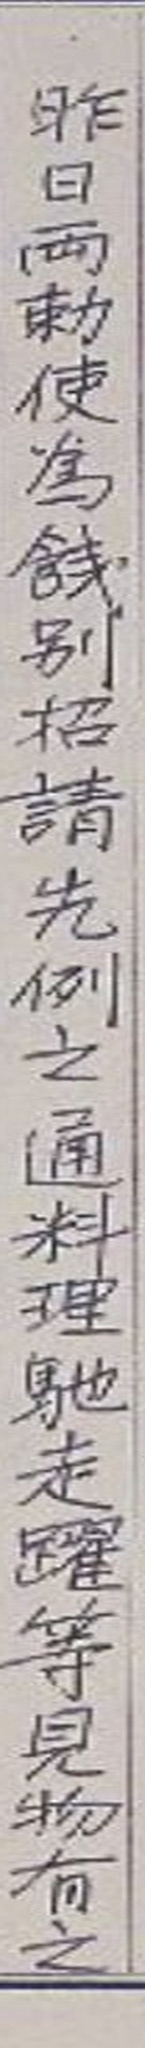昨日両勅使為餞別招請先例之通料理馳走躍等見物有之
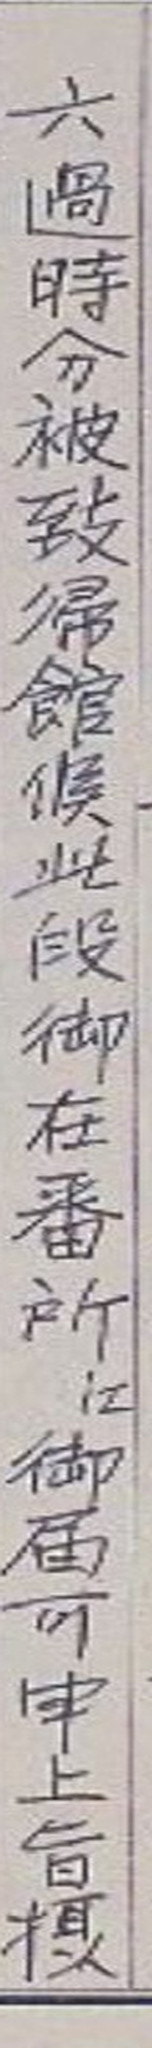六過時分被致帰館候此段御在番所え御届可申上旨摂
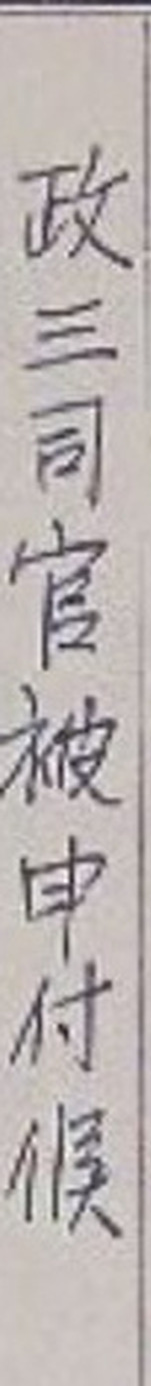政三司官被申付候
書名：支那冊封使来琉諸記 下巻
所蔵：University of the Ryukyus Library
